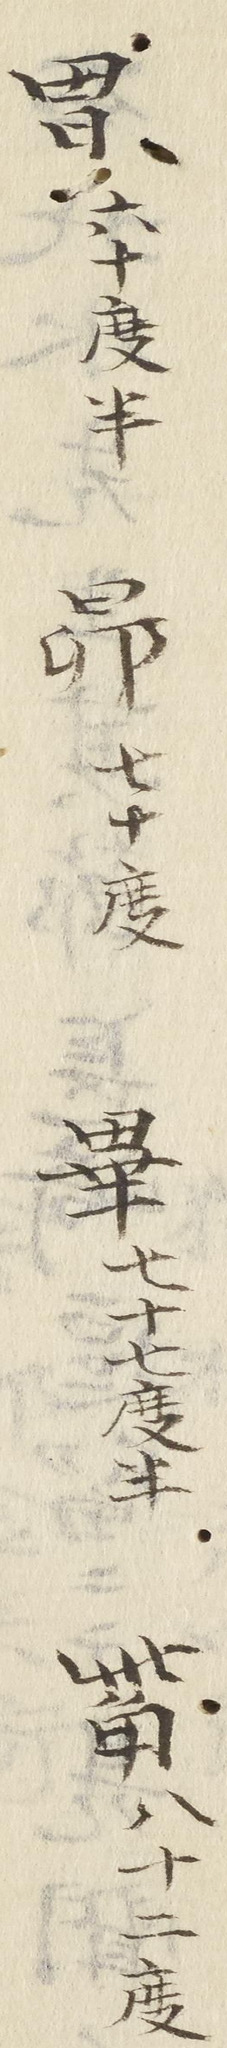胃六十度半昴七十度畢七十七度半觜八十二度
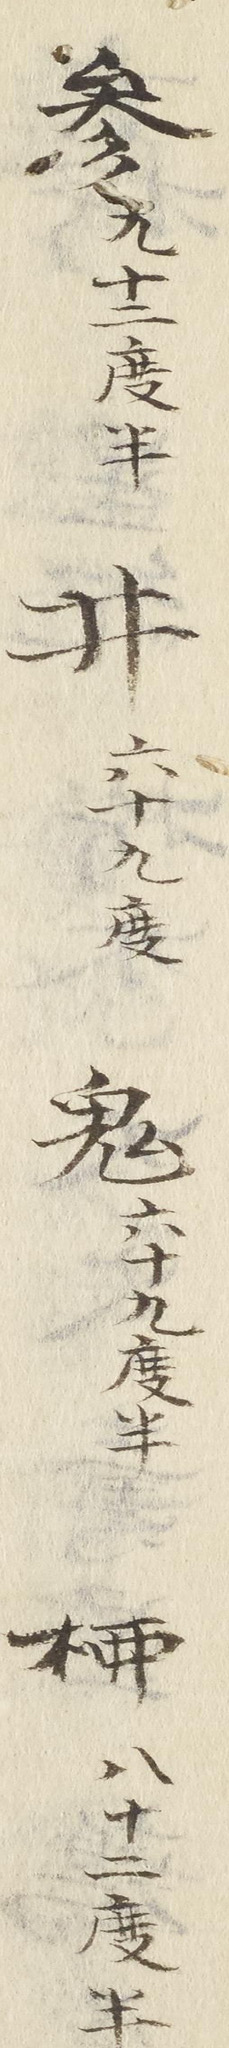参九十二度半井六十九度鬼六十九度半柳八十二度半
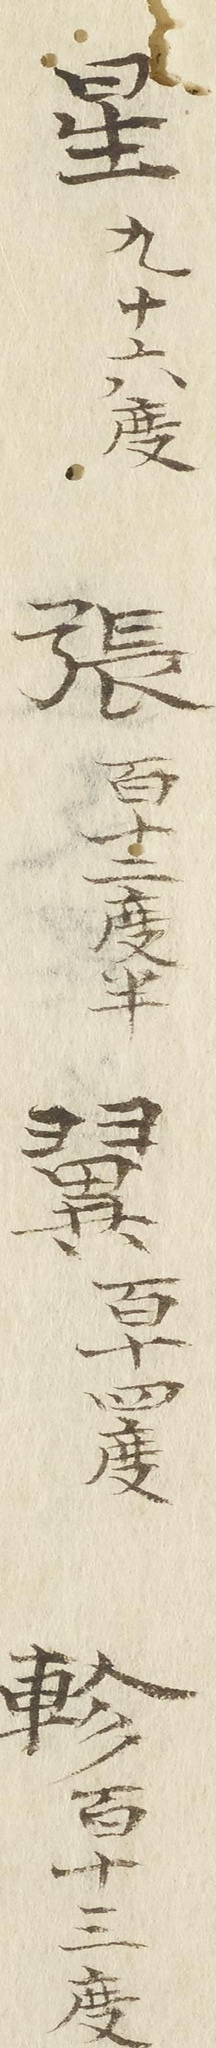星九十六度張百十二度半翼百十四度軫百十三度半
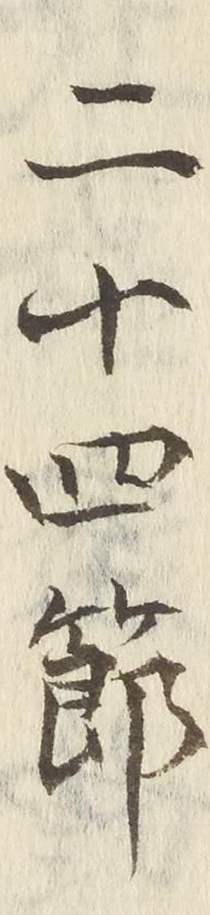二十四節
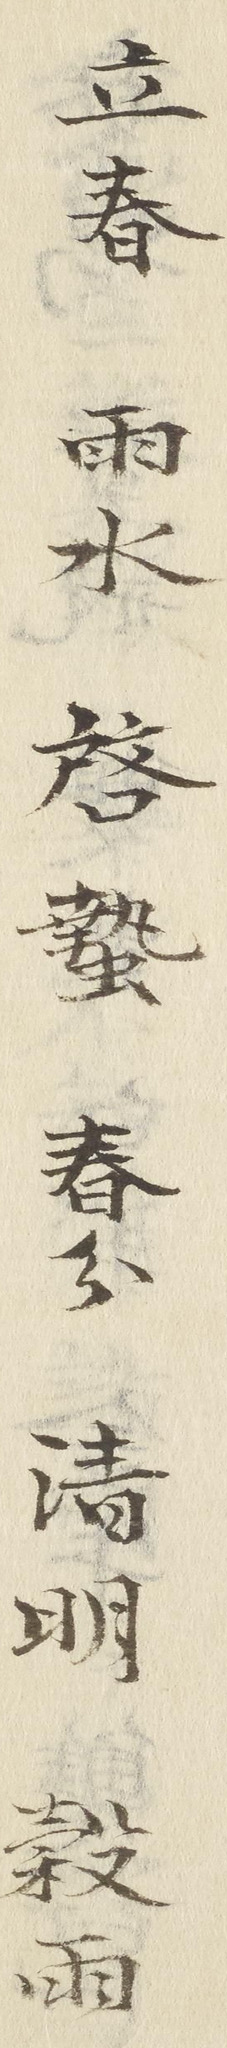立春雨水啓蟄春分清明穀雨
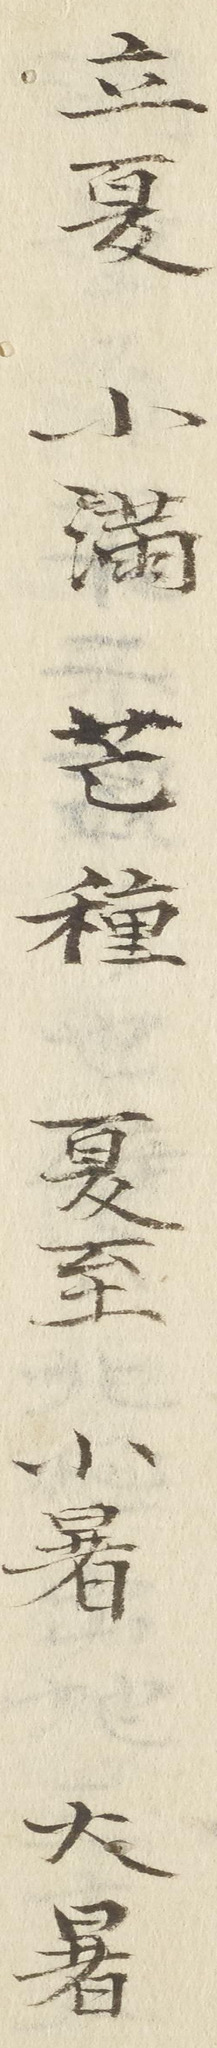立夏小満芒種夏至小暑大暑
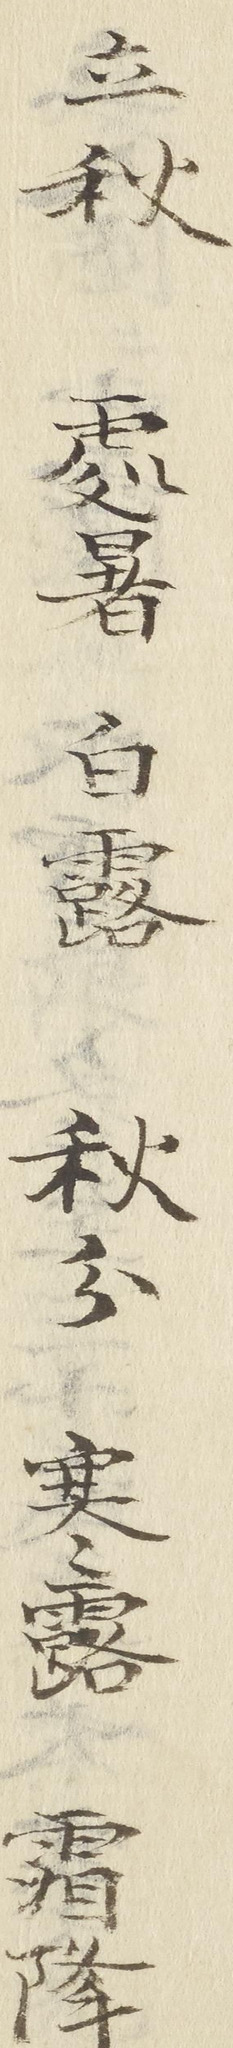立秋処暑白露秋分寒露霜降

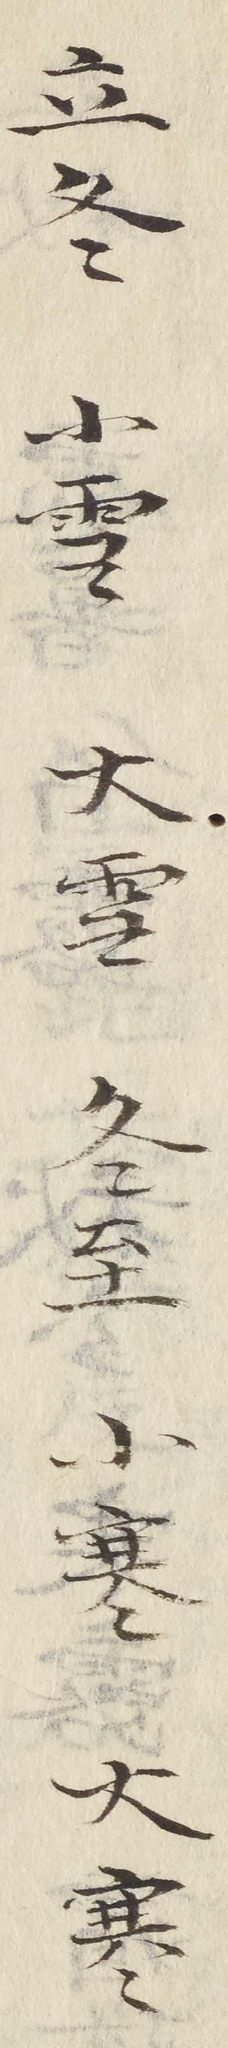立冬小雪大雪冬至小寒大寒
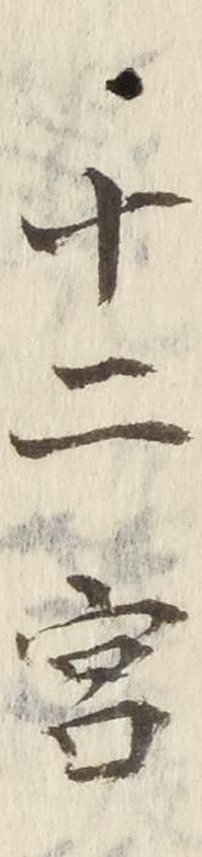十二宮
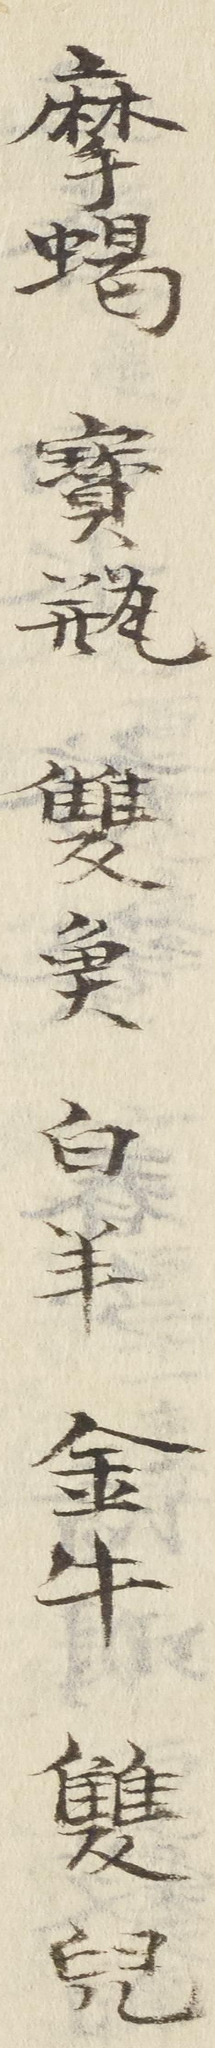摩蝎宝瓶双魚白羊金牛双児
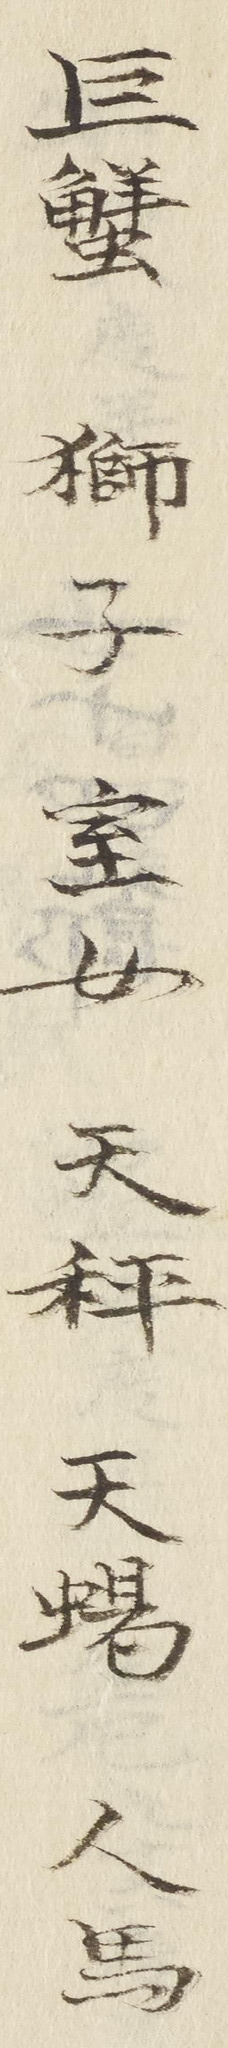巨蟹獅子室女天秤天蝎人馬
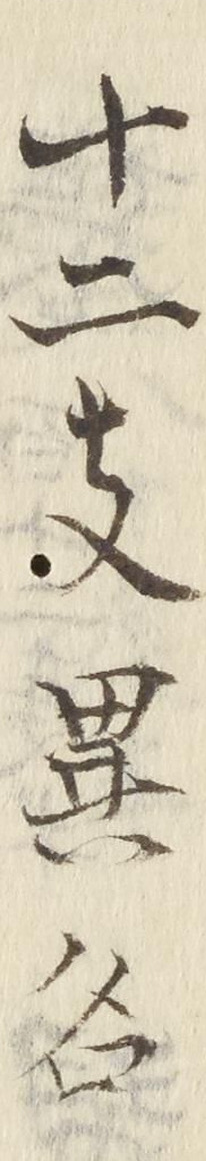十二支異名
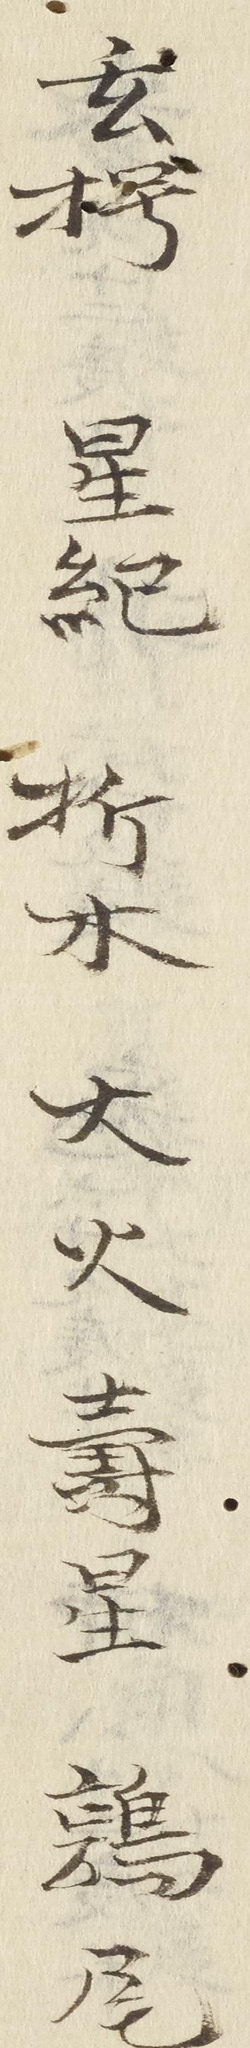玄枵星紀折木大火寿星鶉尾
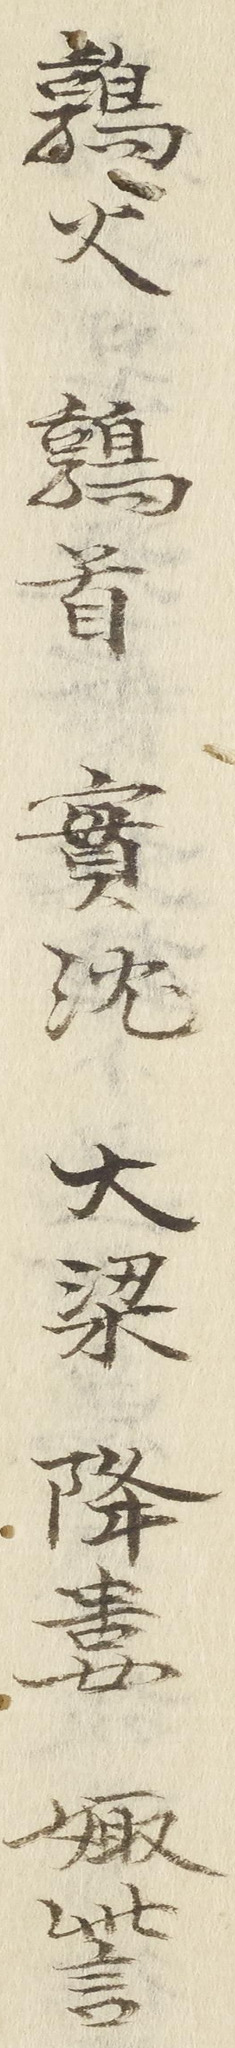鶉火鶉首実沈大梁降婁娵訾
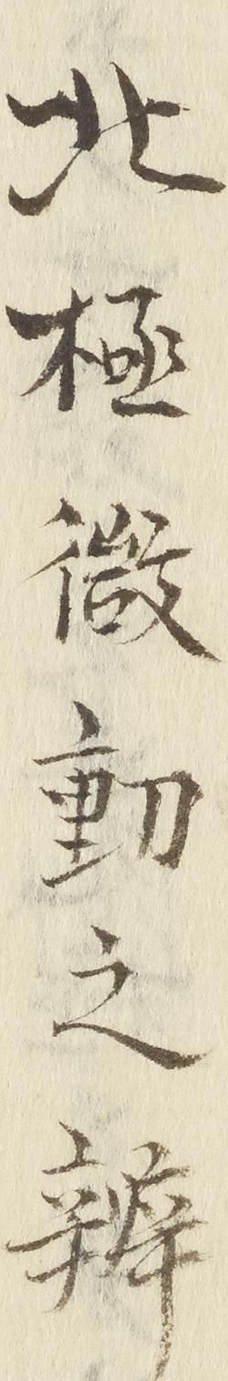北極微動ノ弁
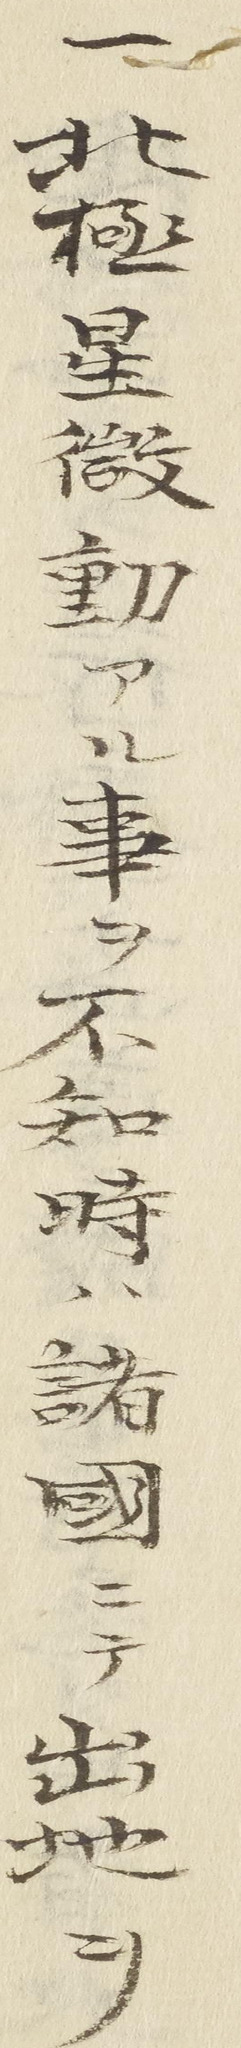一北極星微動アル事ヲ不知時ハ諸国ニテ出地ヲ
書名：天象話説
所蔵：東京大学地震研究所図書室 Earthquake Research Institute Library, The University of Tokyo, JAPAN
